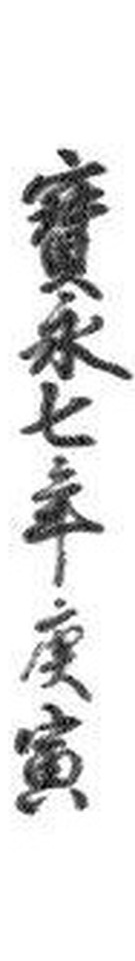宝永七年庚寅
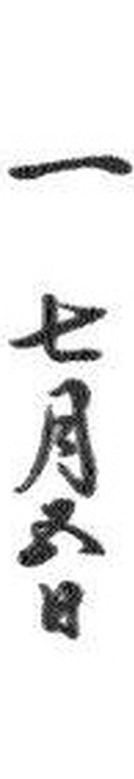一七月五日
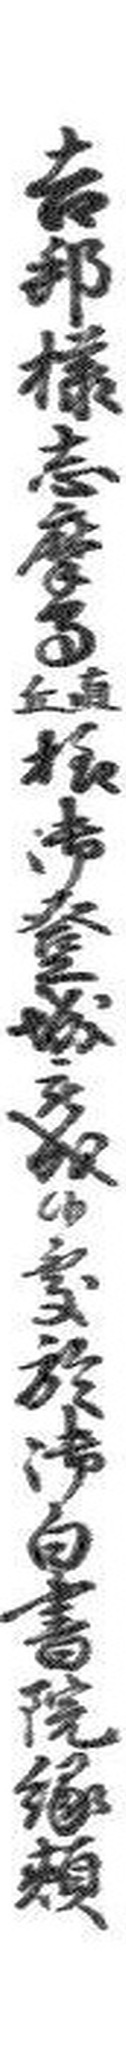吉邦様志摩守直丘様御登城被成候処於御白書院縁頬
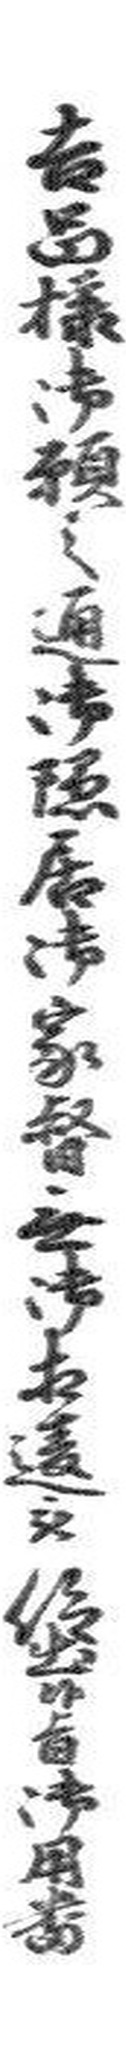吉品様御願之通御隠居御家督無御相違被仰出候旨御用番
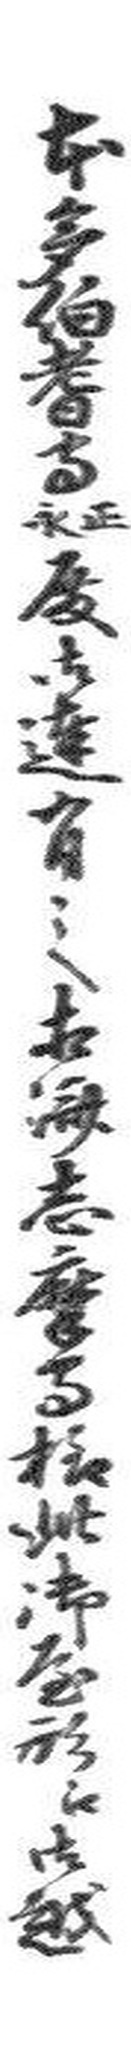本多伯耆守正永殿御達有之相済志摩守様此御屋形江御越
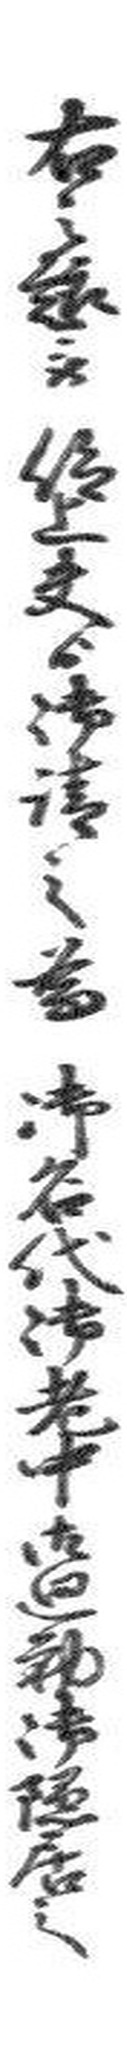右之趣被仰上夫ゟ御請之為御名代御老中御廻勤御隠居之

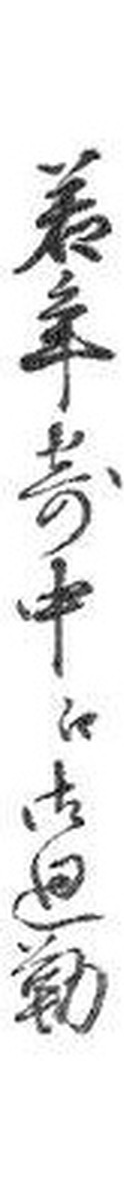若年寄中江御廻勤
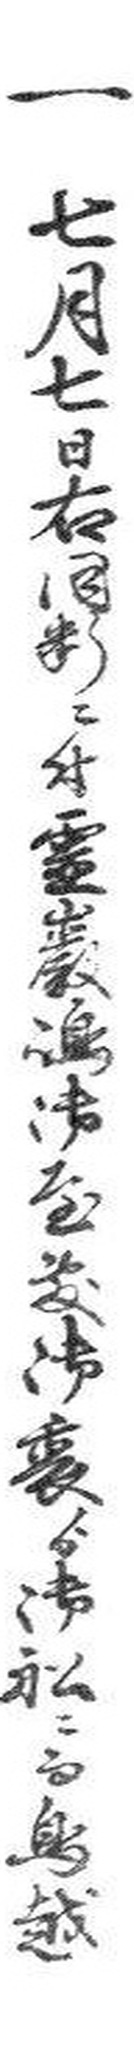一七月七日右同断ニ付霊巌嶋御屋敷御裏ゟ御船ニ而鳥越
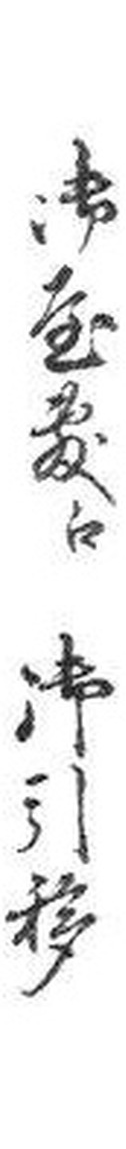御屋敷江御引移
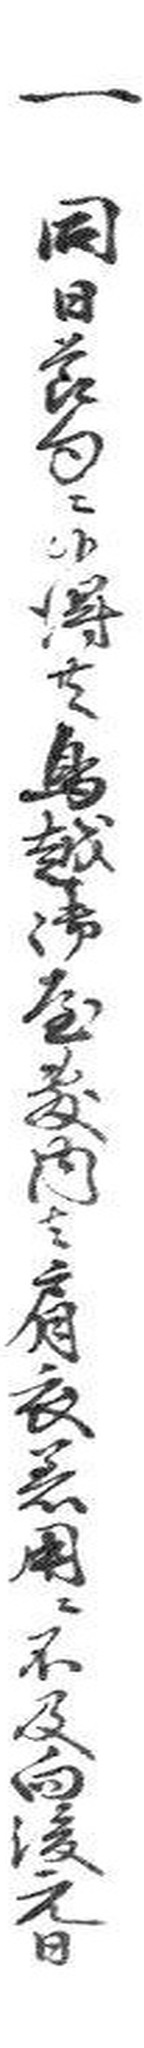一同日節句ニ候得共鳥越御屋敷内者肩衣着用ニ不及向後元日
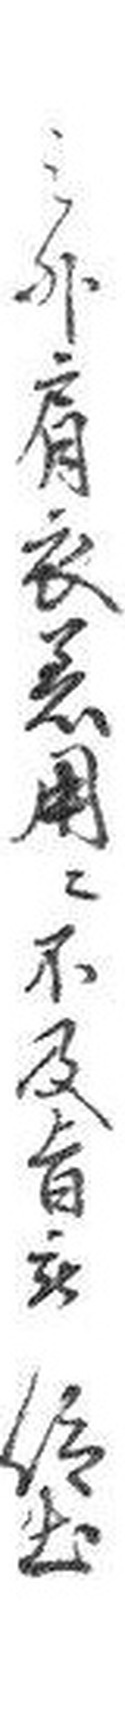之外肩衣着用ニ不及旨被仰出
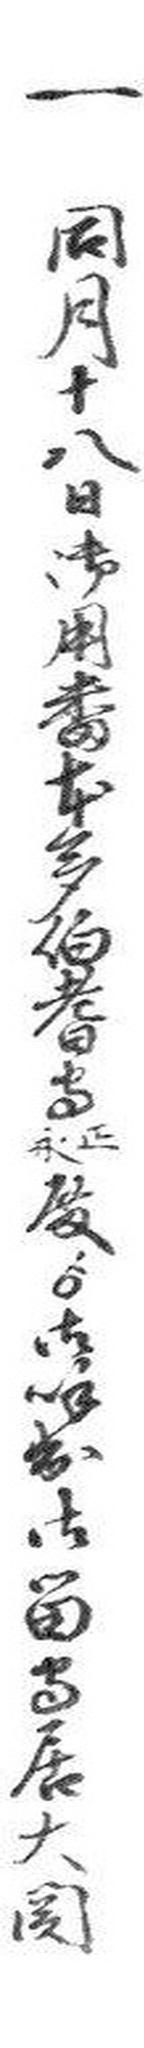一同月十八日御用番本多伯耆守正永殿ゟ御呼出御留守居大関
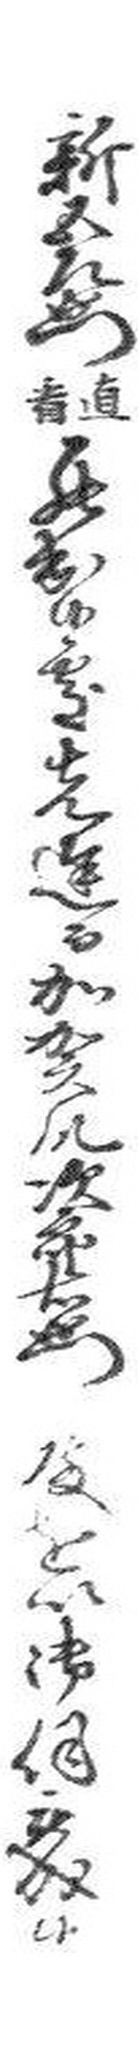新五左衛門直看罷出候処先達而加賀爪次郎右衛門殿を以御伺被成候
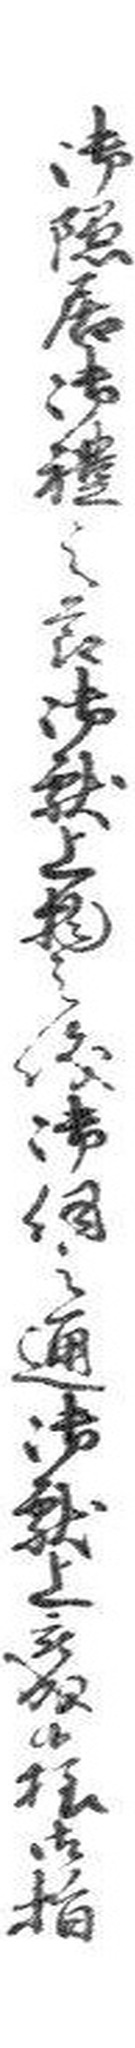御隠居御礼之節御献上物之儀御伺之通御献上被成候様御指
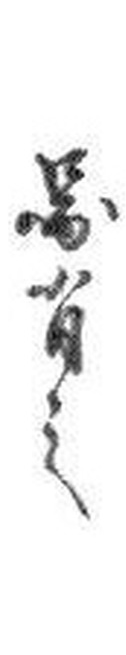図有之
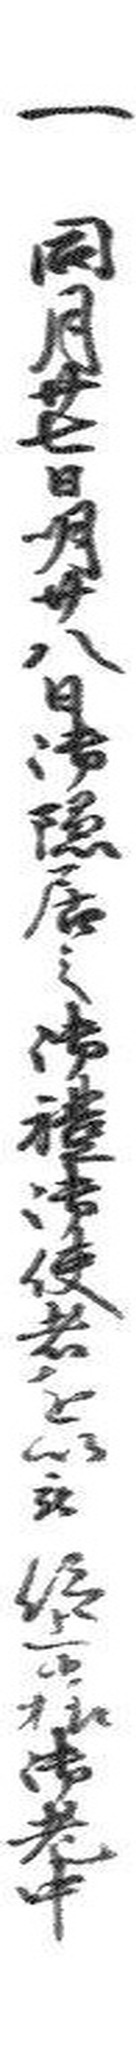一同月廿七日明廿八日御隠居之御礼御使者を以被仰上御老中
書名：家譜 二十六 吉品公 従宝永七年到正徳二年
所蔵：福井県文書館 Fukui Prefectural Archives
